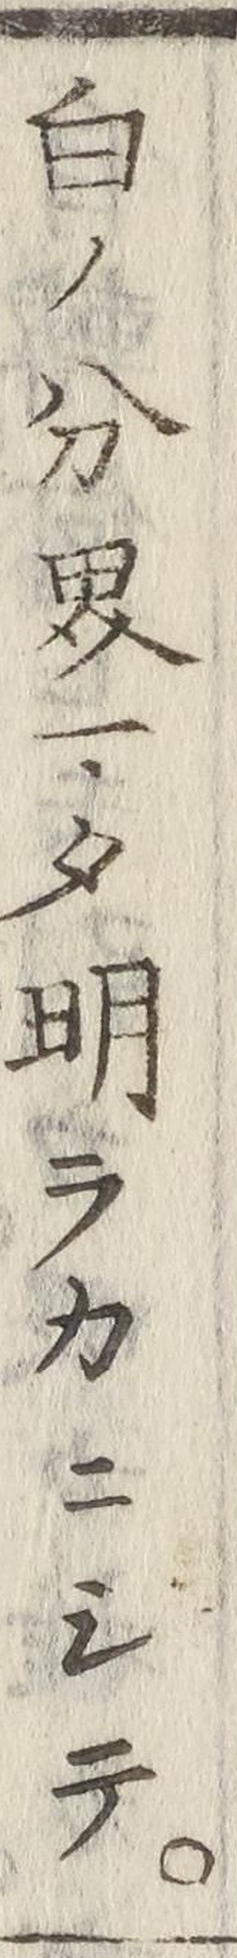白ノ分界マタ明ラカニシテ。
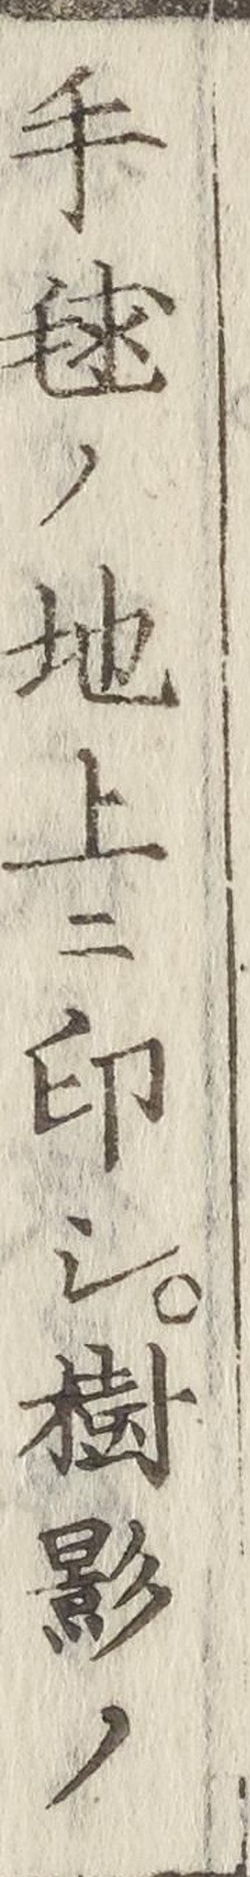手毬ノ地上ニ印シ。樹影ノ
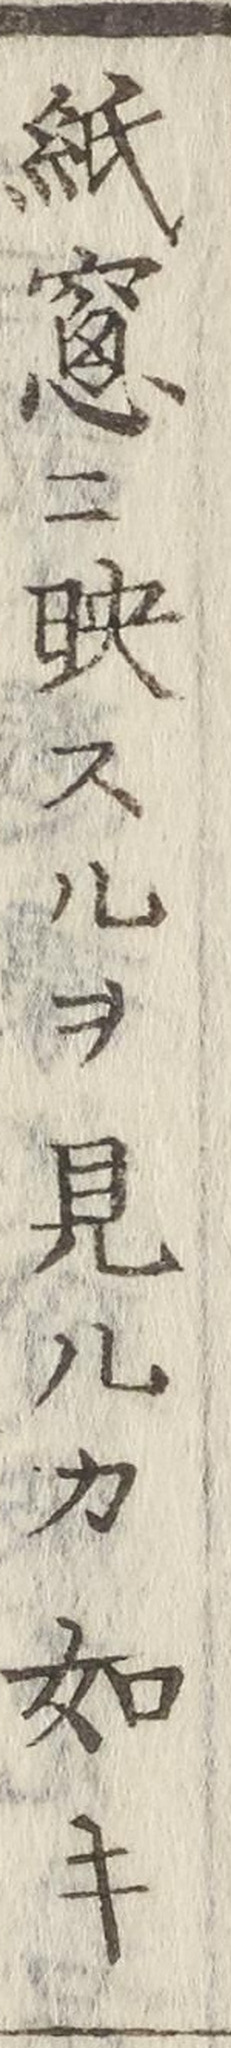紙窓ニ映スルヲ見ルカ如キ
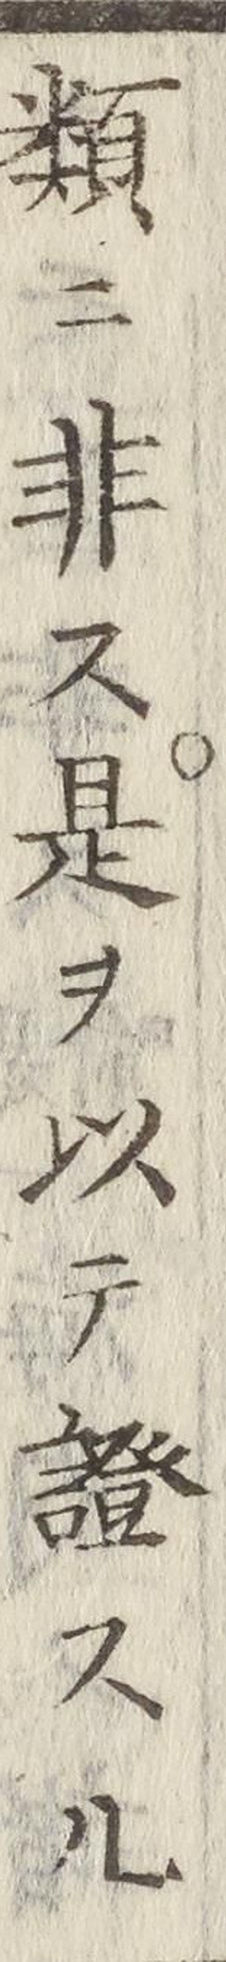類ニ非ス。是ヲ以テ証スル
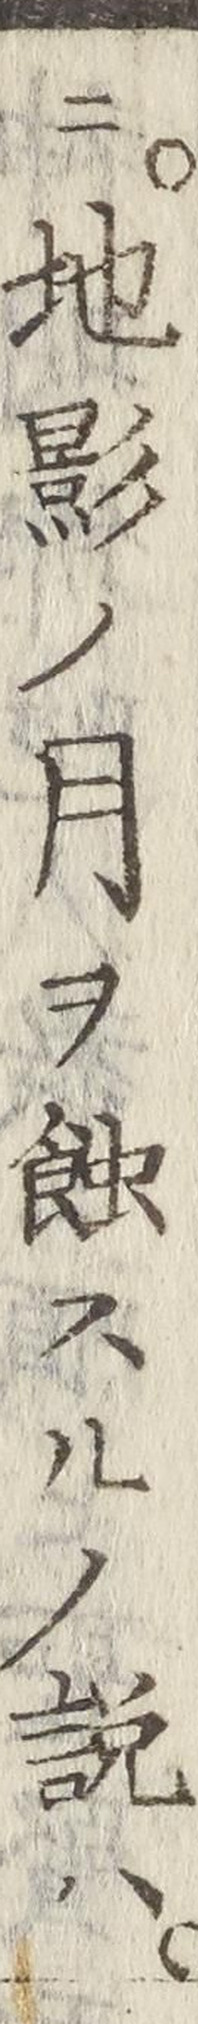ニ。地影ノ月ヲ蝕スルノ説ハ。
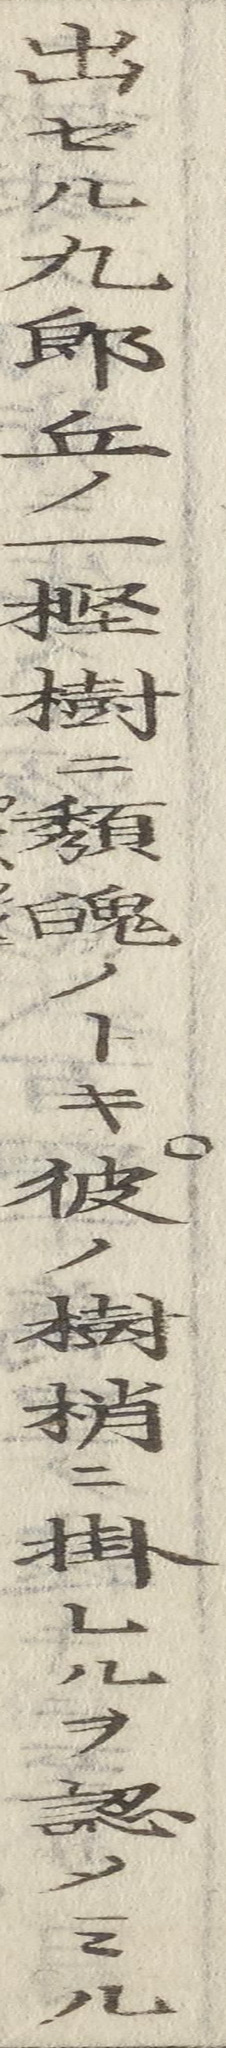出セル九郎丘ノ一樫樹ニ頽魄ノトキ。彼ノ樹梢ニ掛レルヲ認メミル
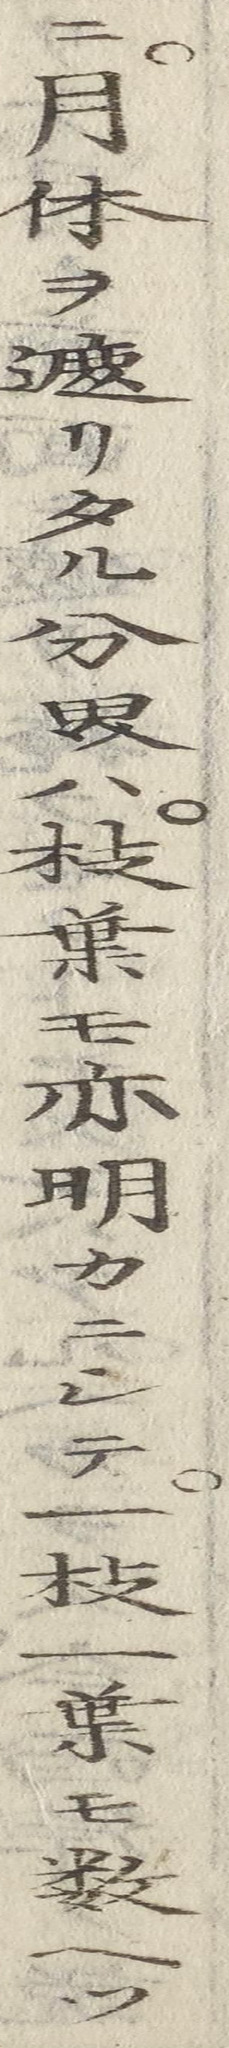ニ。月体ヲ遮リタル分界ハ。枝葉モ亦明カニシテ。一枝一葉モ数ヘツ
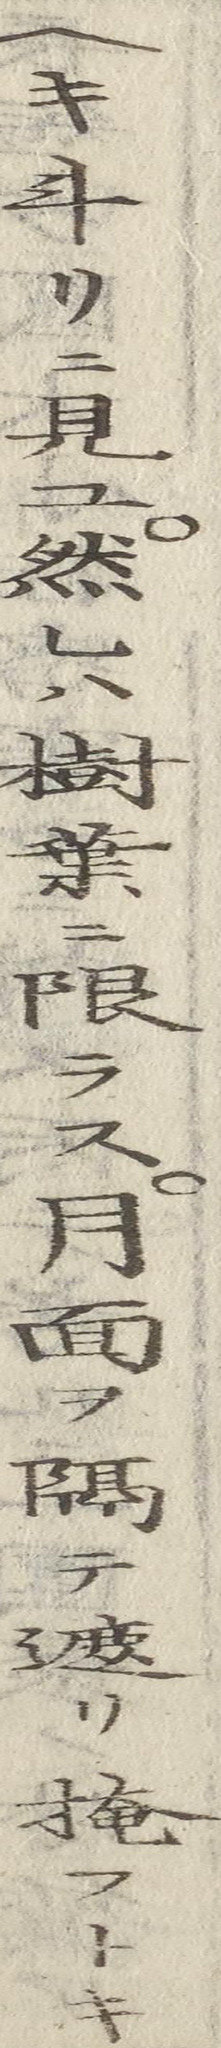ヘキ斗リニ見ユ。然レハ樹葉ニ限ラス。月面ヲ隔テ遮リ掩フトキ

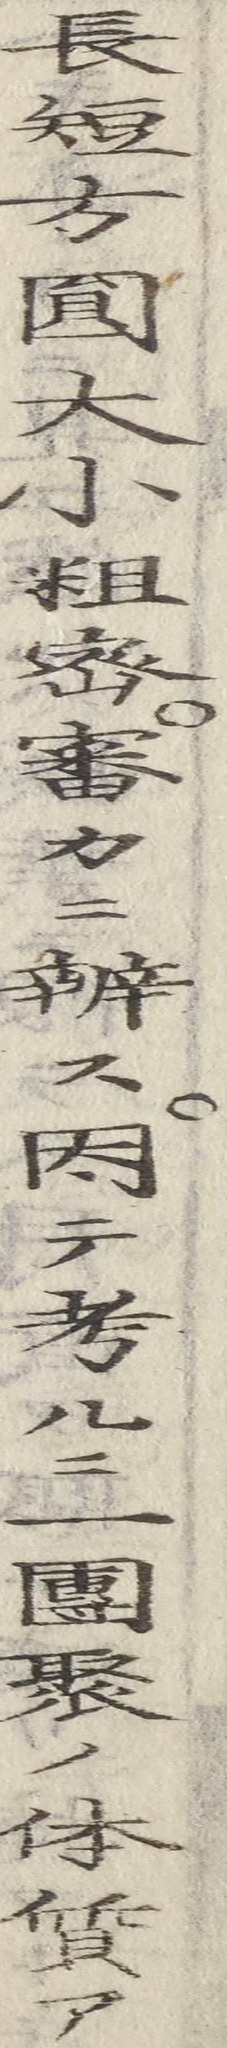長短方円大小粗密。審カニ弁ス。因テ考ルニ一団聚ノ体質ア
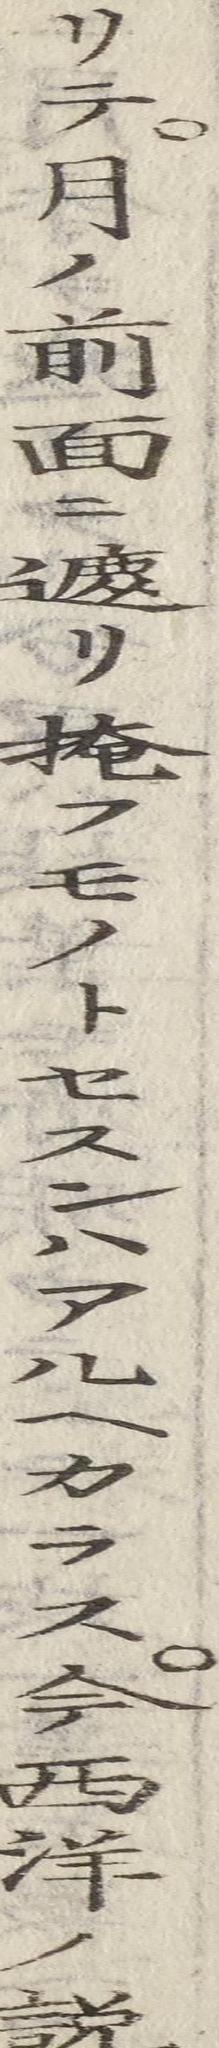リテ。月ノ前面ニ遮リ掩フモノトセスンハアルヘカラス。今西洋ノ説
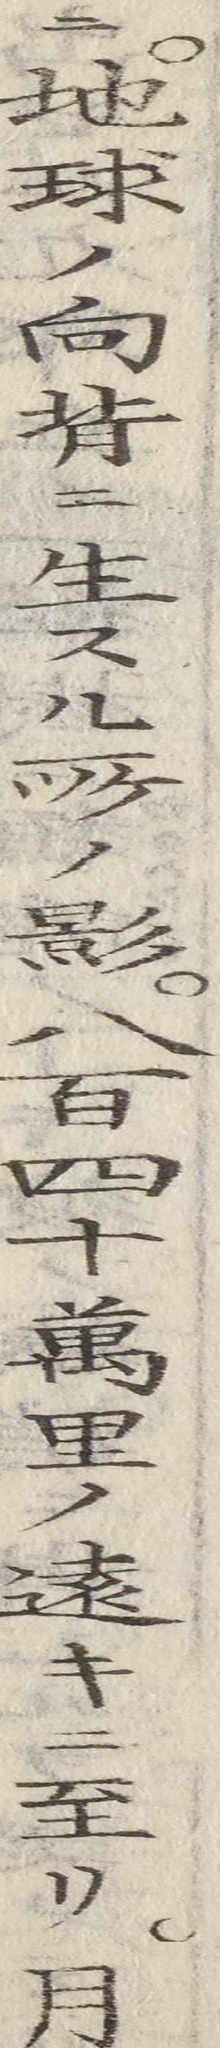ニ。地球ノ向背ニ生スル所ノ影。八百四十万里ノ遠キニ至リ。月
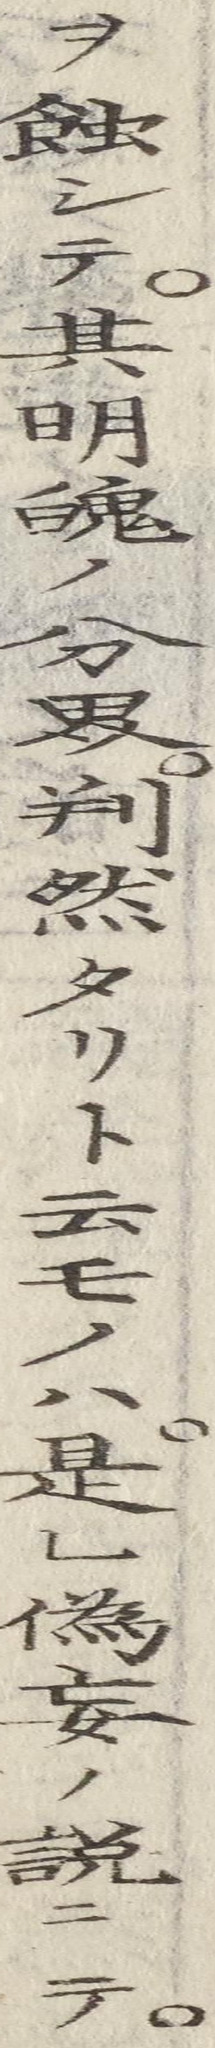ヲ蝕シテ。其明魄ノ分界。判然タリト云モノハ。是レ偽妄ノ説ニテ。
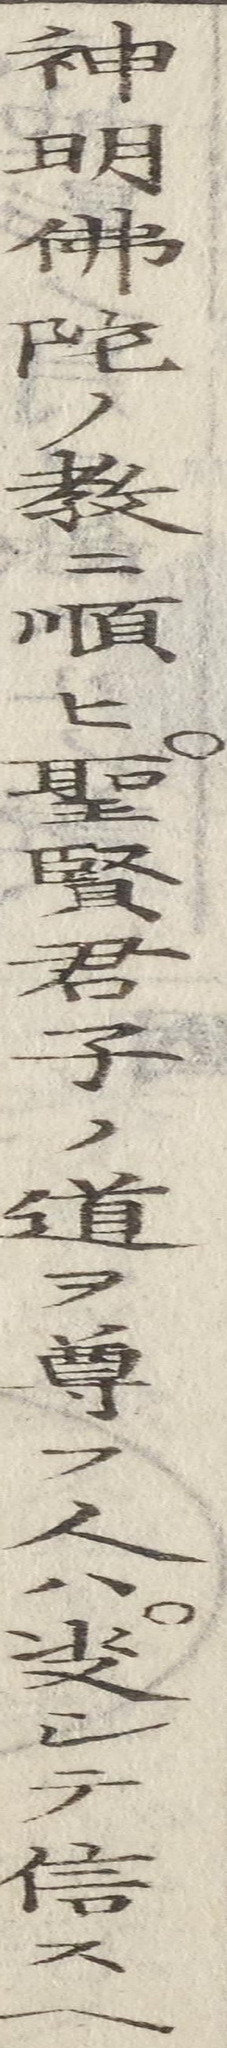神明仏陀ノ教ニ順ヒ。聖賢君子ノ道ヲ尊フ人ハ。叟シテ信スヘ
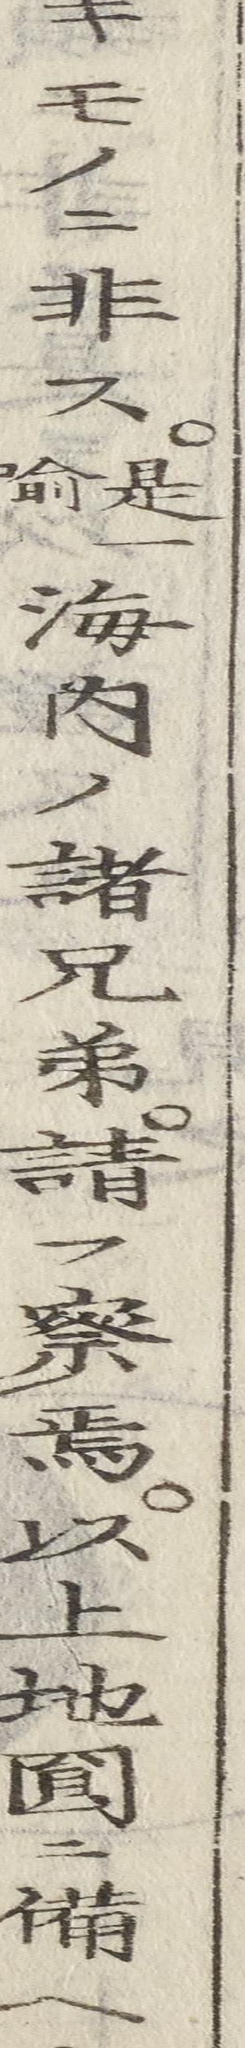キモノニ非ス。是一喩海内ノ諸兄弟。請フ察焉。以上地円ニ備ヘタ
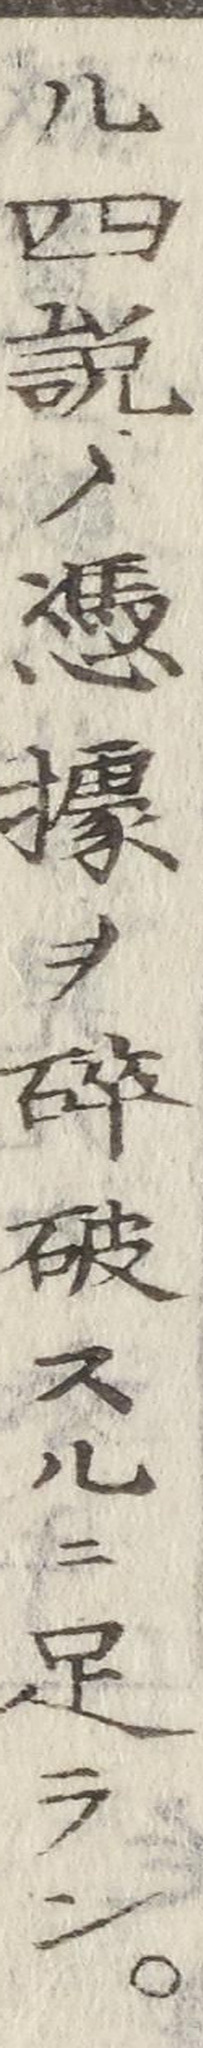ル四説ノ憑拠ヲ砕破スルニ足ラン。
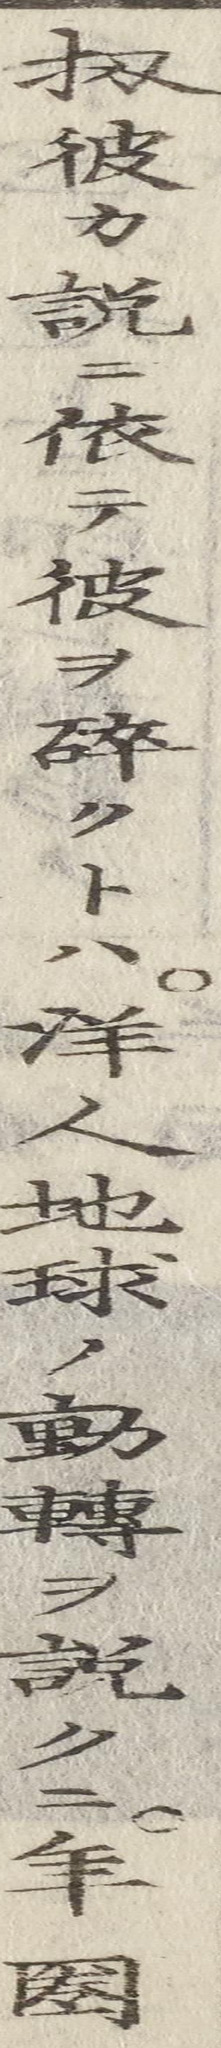扨彼カ説ニ依テ彼ヲ砕クトハ。洋人地球ノ動転ヲ説クニ。年圏
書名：護法新論　中
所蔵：東京大学地震研究所図書室 Earthquake Research Institute Library, The University of Tokyo, JAPAN
